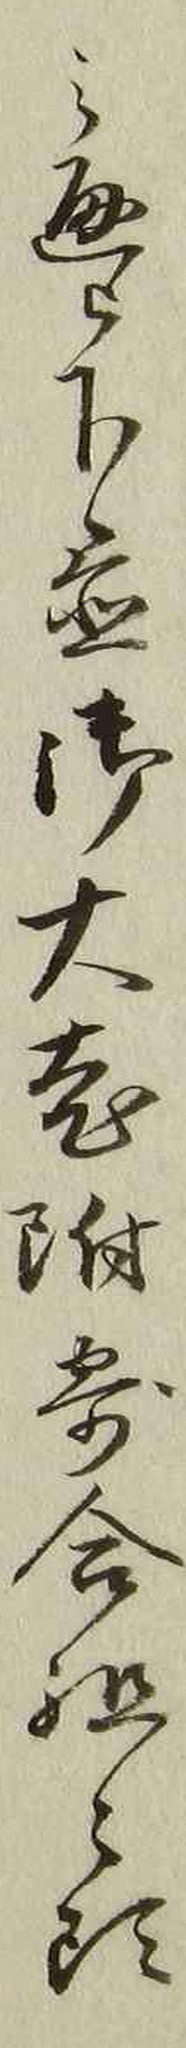之通被下置御大老附寄合組之頭
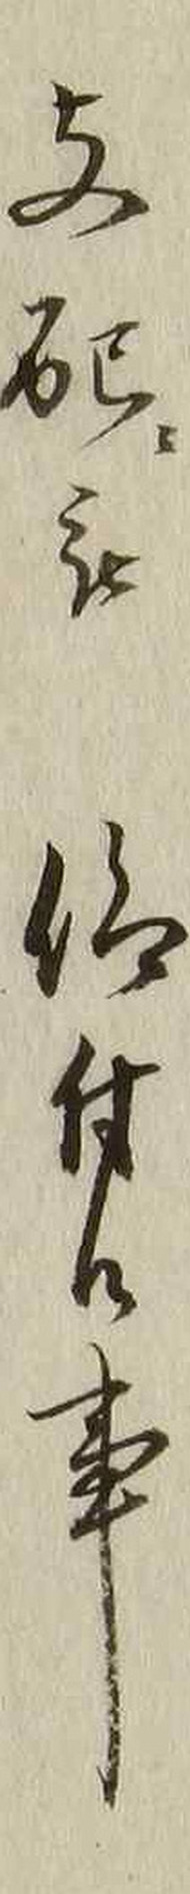支配被仰付候事
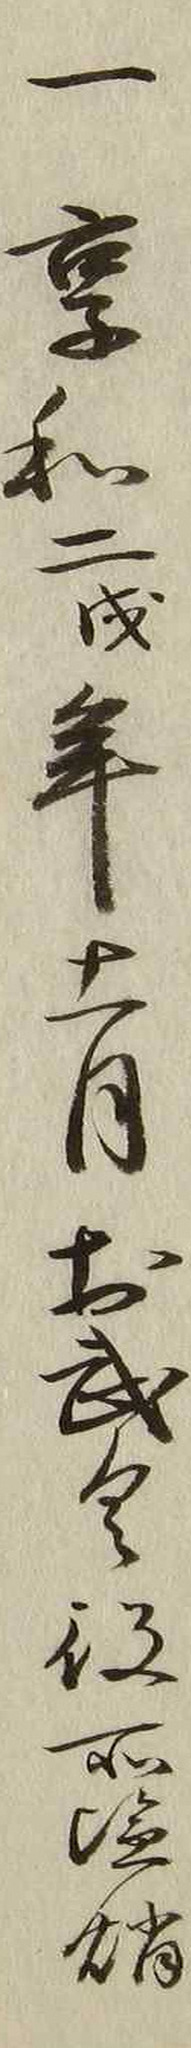一享和二戌年十一月於武具役所塩硝
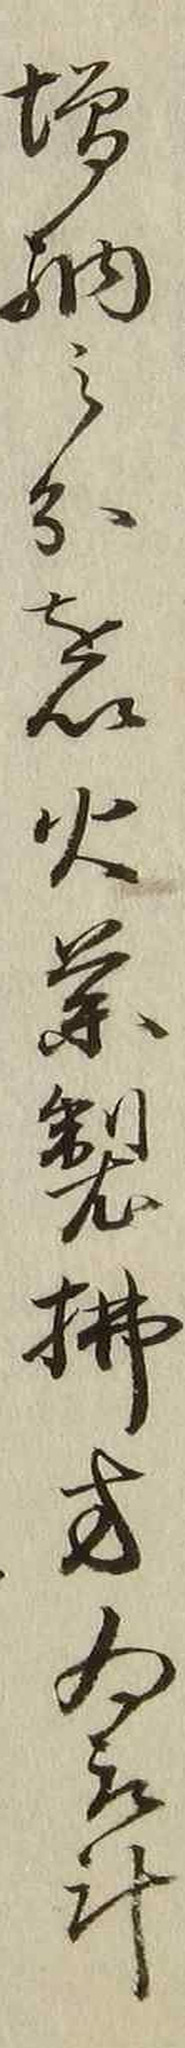増納之分を以火薬製拂方為取計
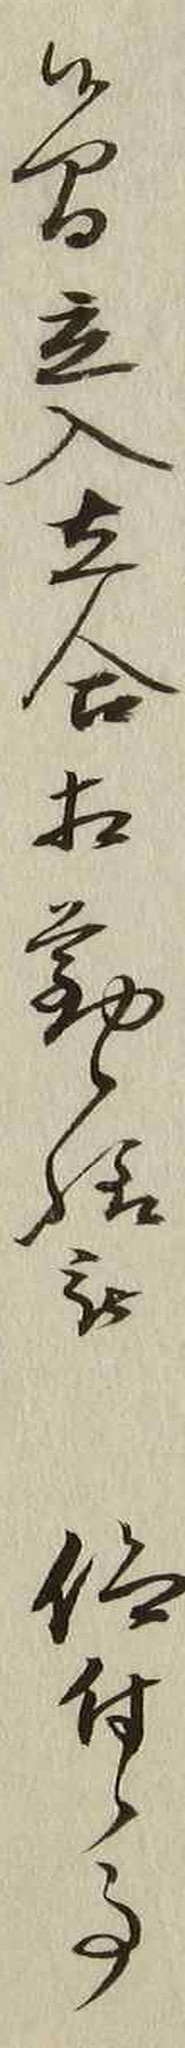候間立入立合相勤候様被仰付候事
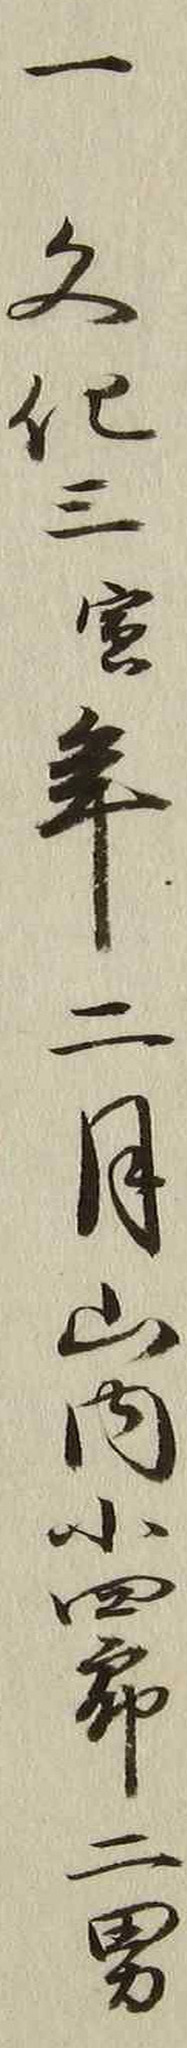一文化三寅年二月山内小四郎二男
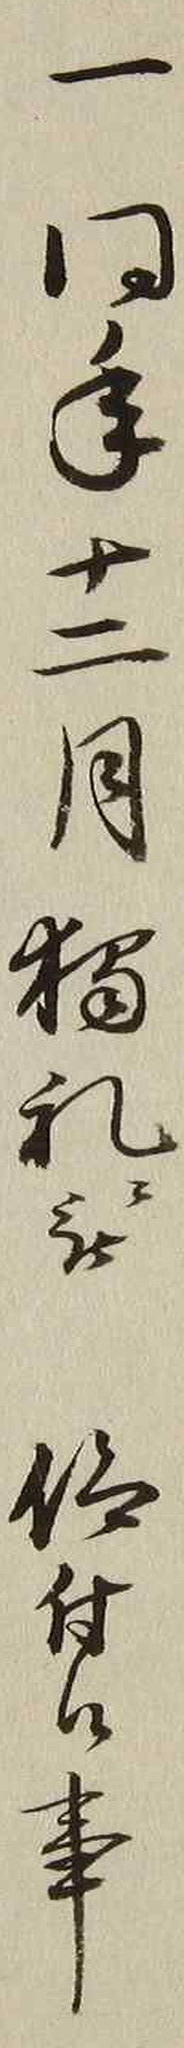一同年十二月獨礼被仰付候事
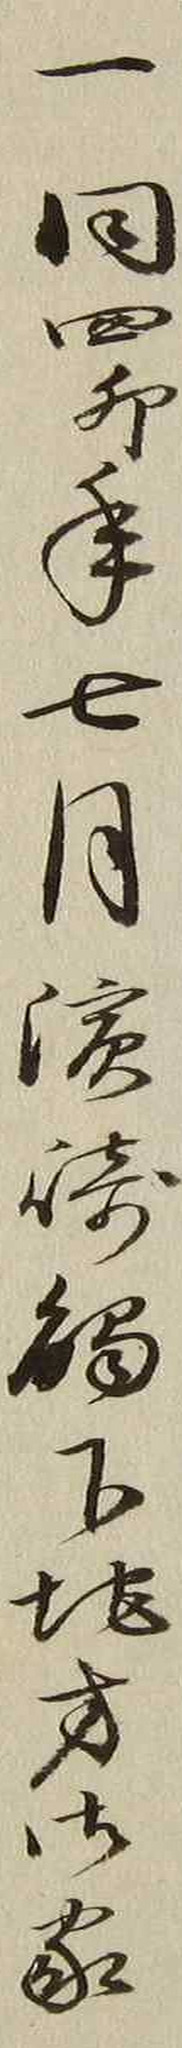一同四卯年七月濱崎觸下地方御家
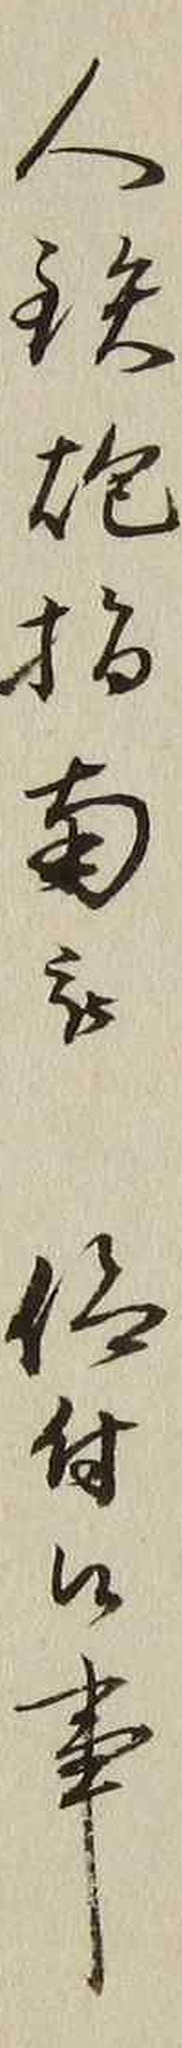人鉄炮指南被仰付候事
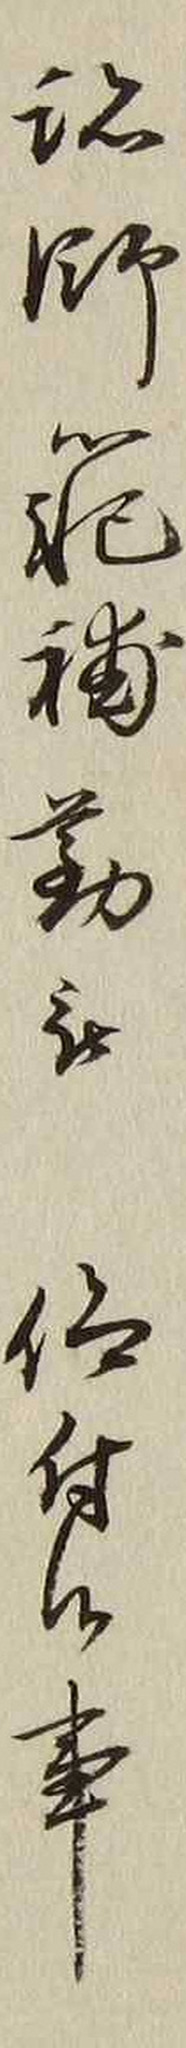諸師範補勤被仰付候事
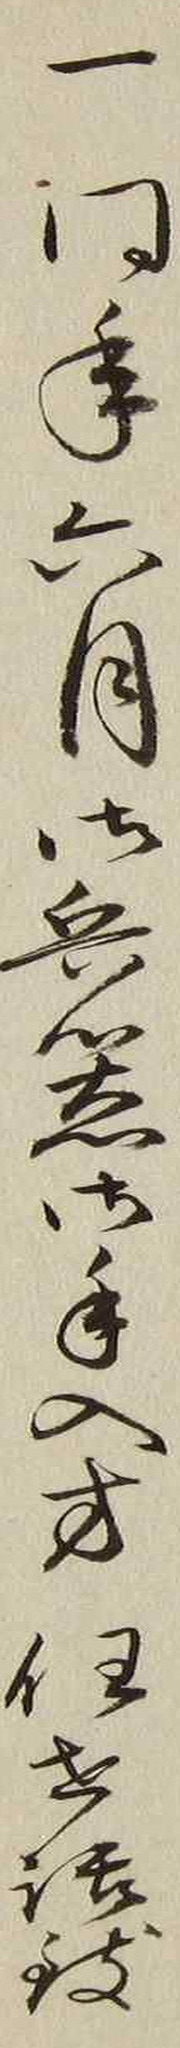一同年六月御兵器御手入方任世話致
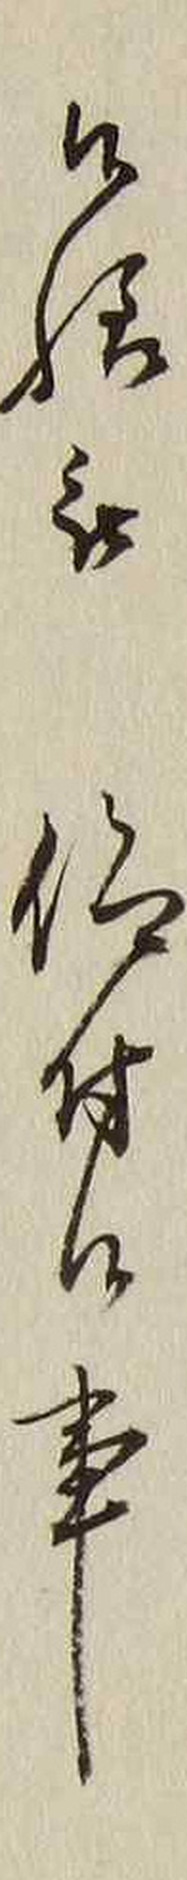候様被仰付候事
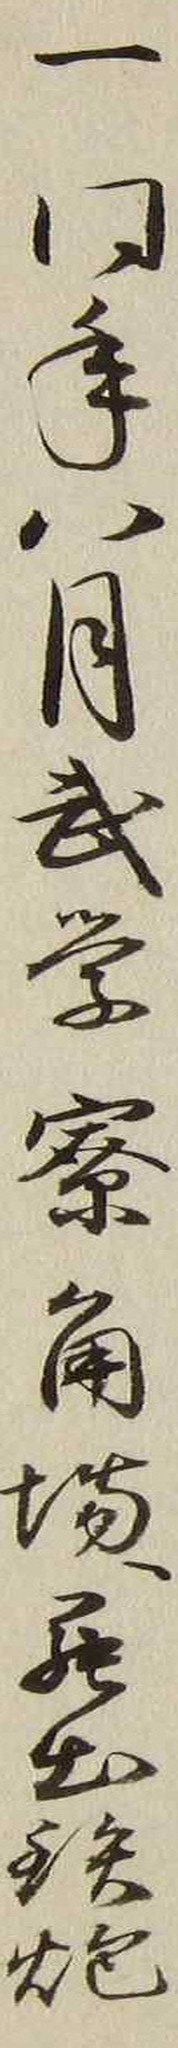一同年八月武学寮角場罷出鉄炮
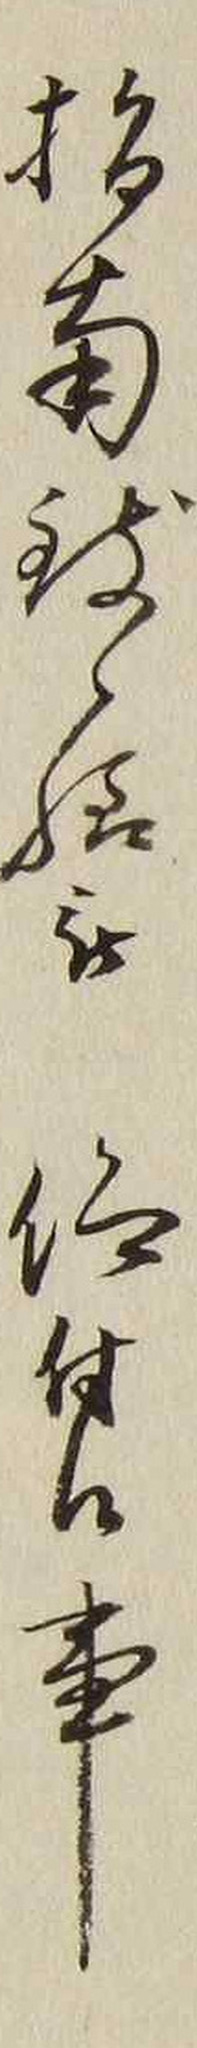指南致候様被仰付候事
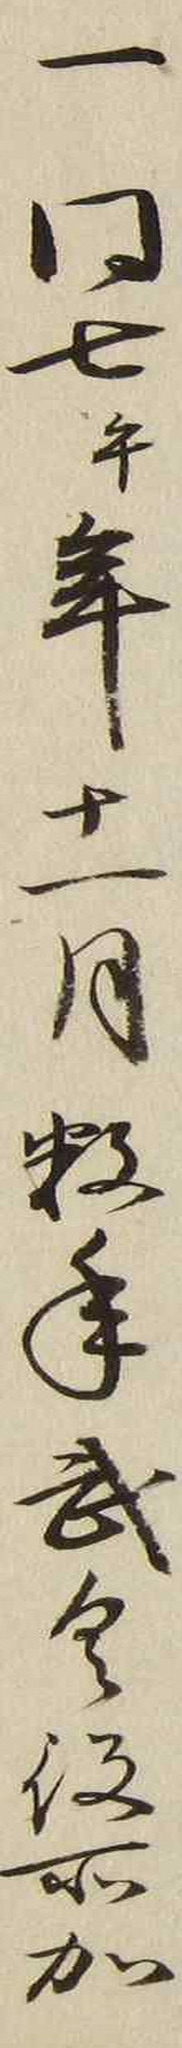一同七午年十一月数年武具役所加

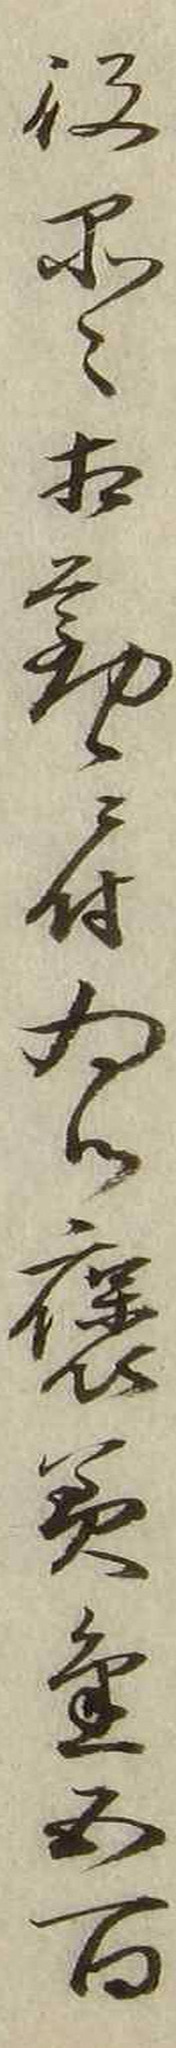役品々相勤候付為御褒美金五百
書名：諸士系譜　巻之102　か之部10
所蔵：会津若松市立会津図書館
